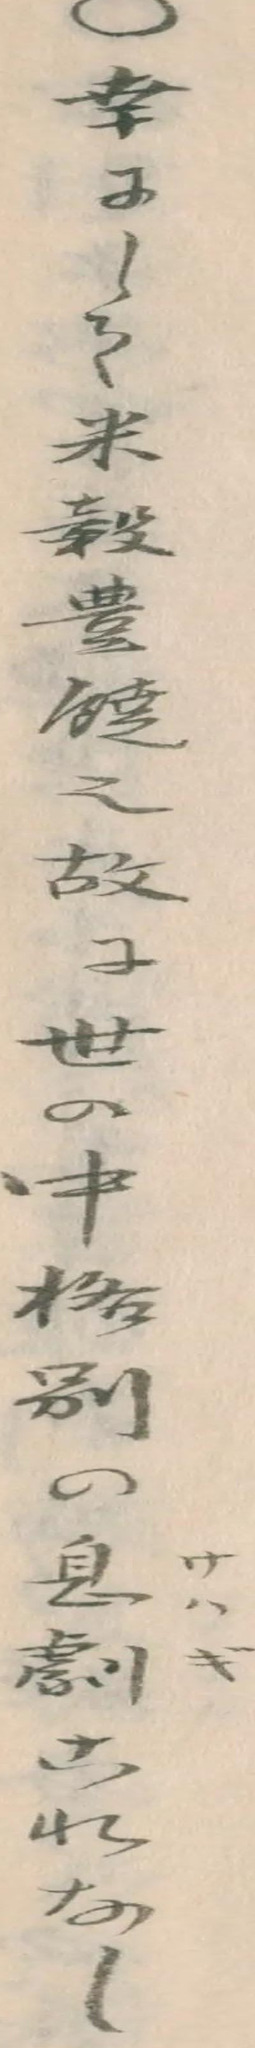〇幸にして米穀豊饒也故に世の中格別の息劇これなし

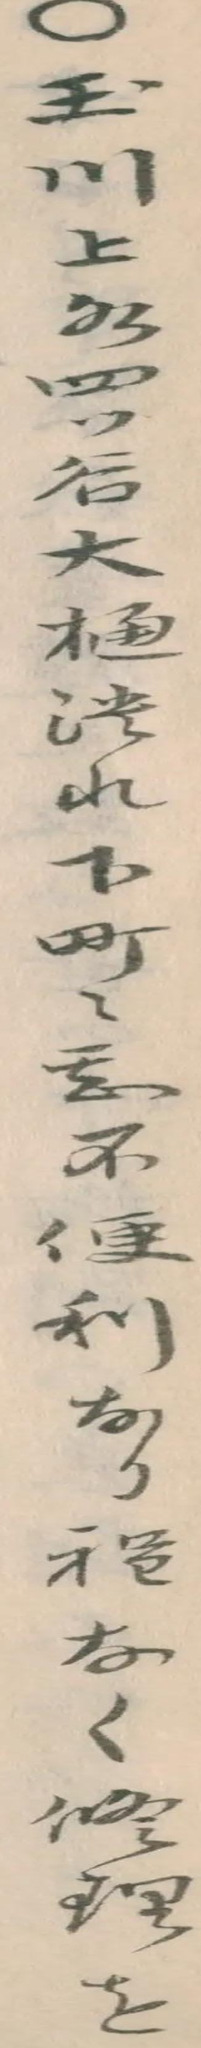〇玉川上水四ツ谷大樋潰れ下町々甚不便利なり程なく修理を
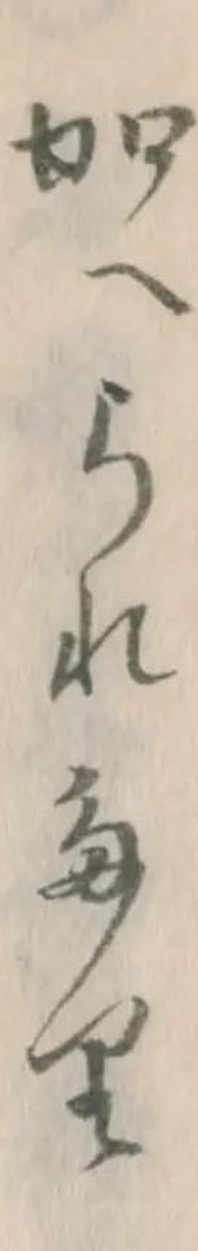加へられたり
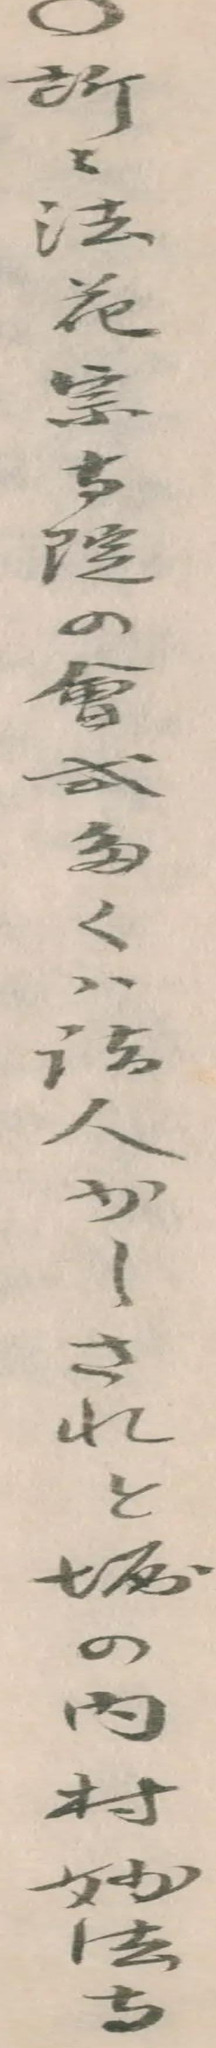〇所々法花宗寺院の会式多くは諸人少しされと堀の内村妙法寺
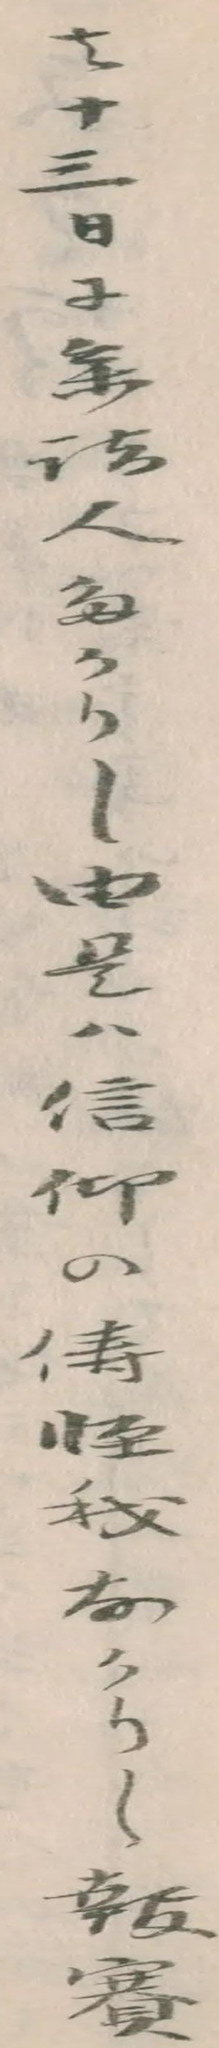は十三日に参詣人多かりし由是は信仰の俦怪我なかりし報賽
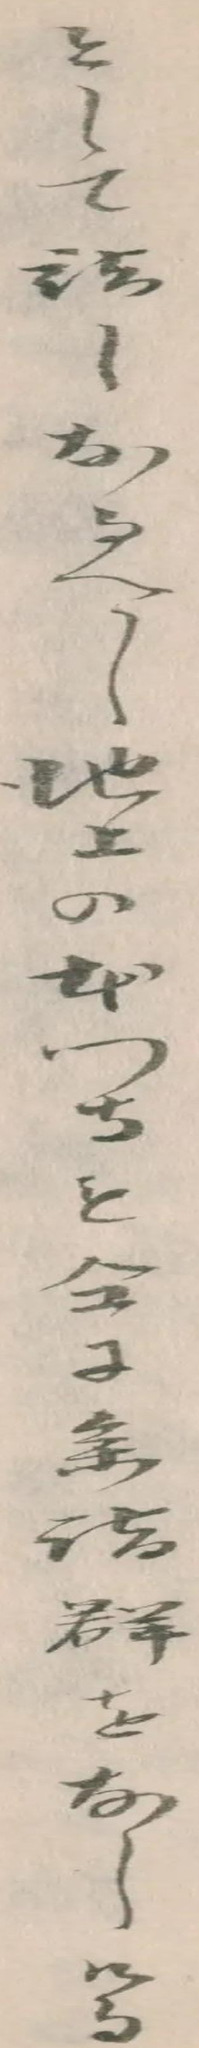として詣しなるへし池上の本門寺も仝に参詣群をなしける
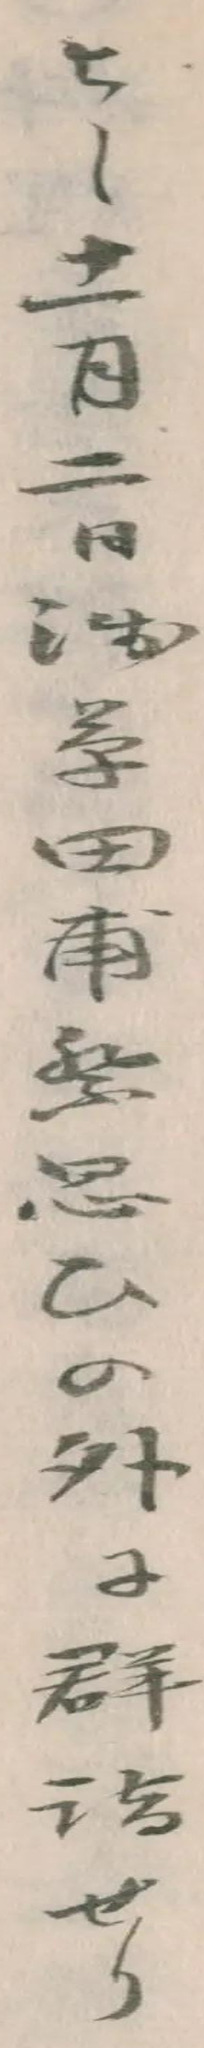よし十一月二日浅草田甫祭思ひの外に群詣せり
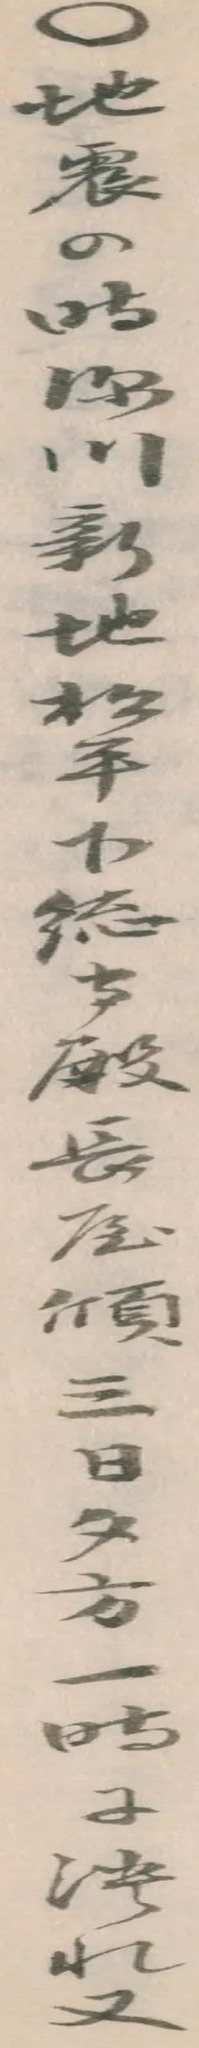〇地震の時深川新地松平下総守殿長屋傾三日夕方一時に潰れ又
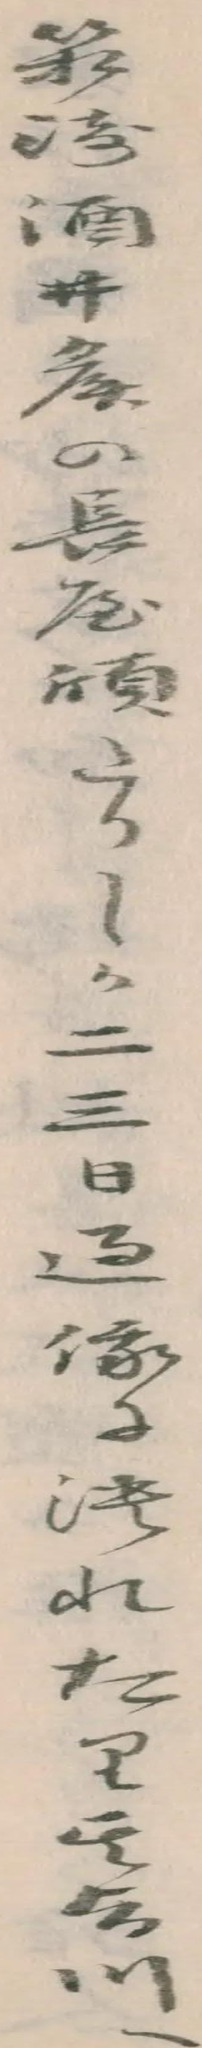箱崎酒井侯の長屋傾たりしか二三日過俄に潰れたり其旨川へ
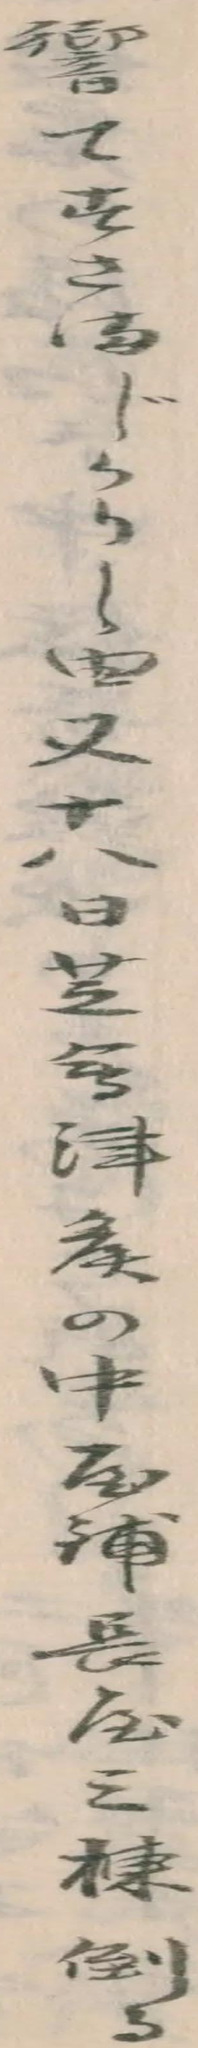響てすさまじかりし由又十八日芝会津侯の中屋鋪長屋三棟倒る
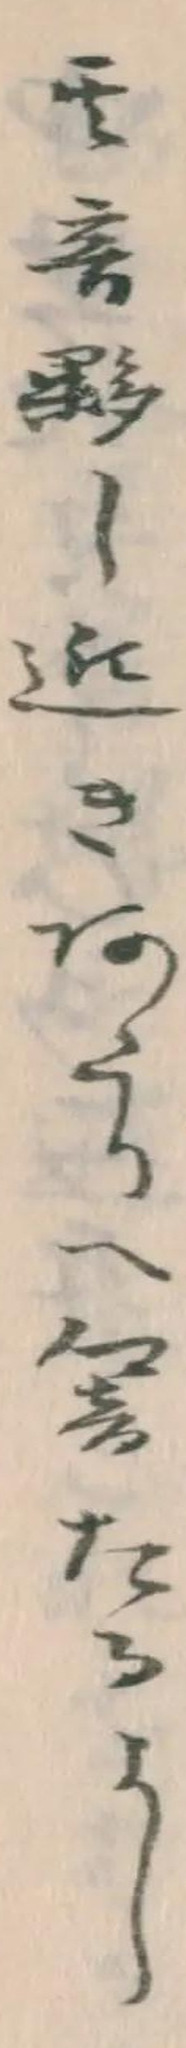其音夥し近きあたりへ響たるよし
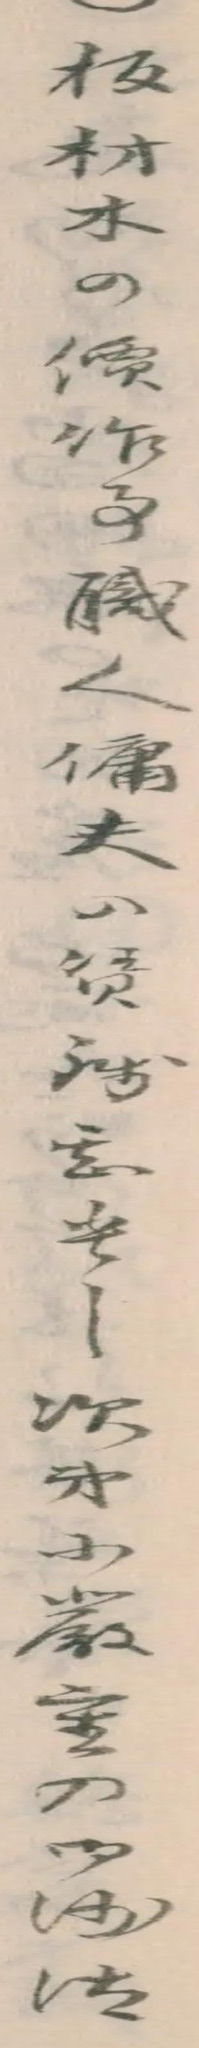〇板材木の価作事職人傭夫の賃銭甚貴し次第に厳重の御沙汰
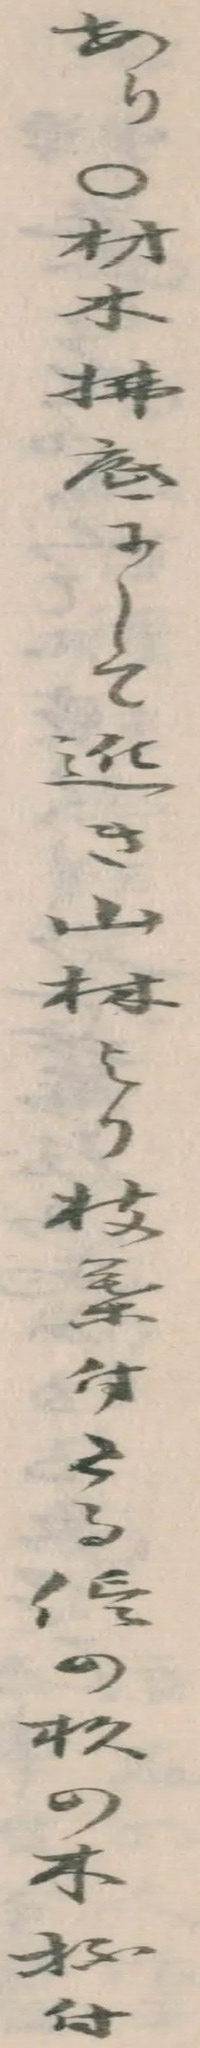あり○材木は拂底にして近き山林より枝葉付たる儘の杉の木抔付
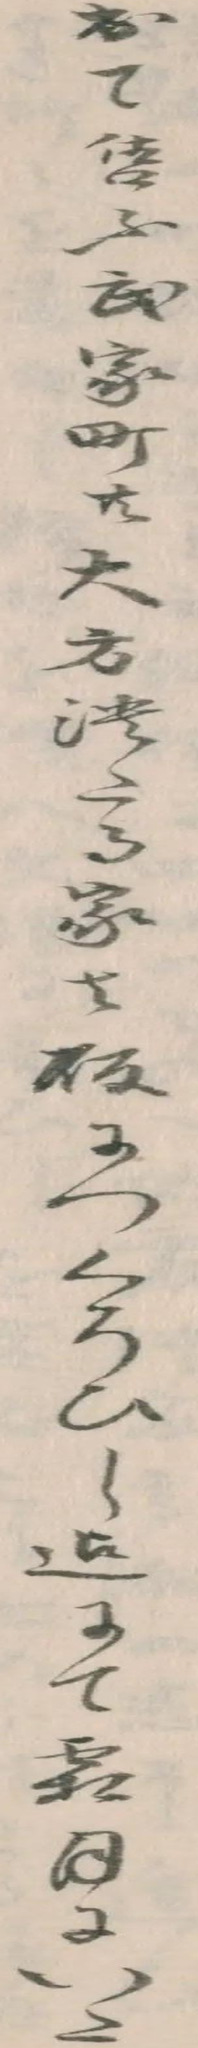出て售ふ武家町共大方潰たる家は仮につくろひし迄にて霜月にいた
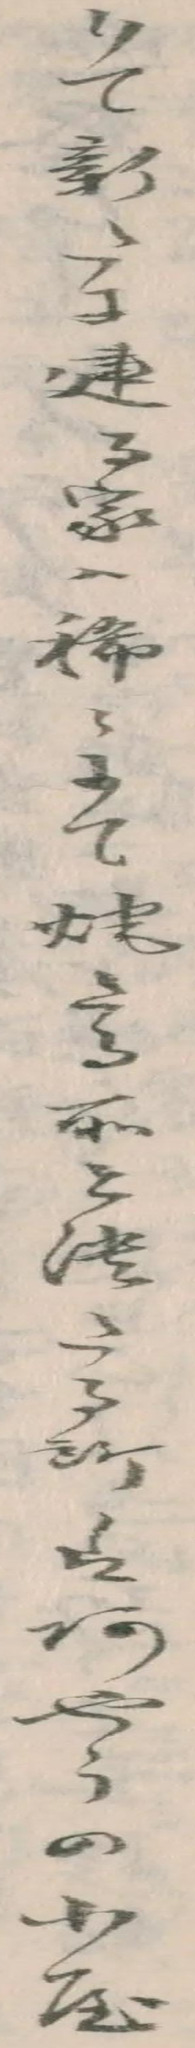りて新たに建る家は稀々にて焼たる所と潰たる所はあやうの小屋
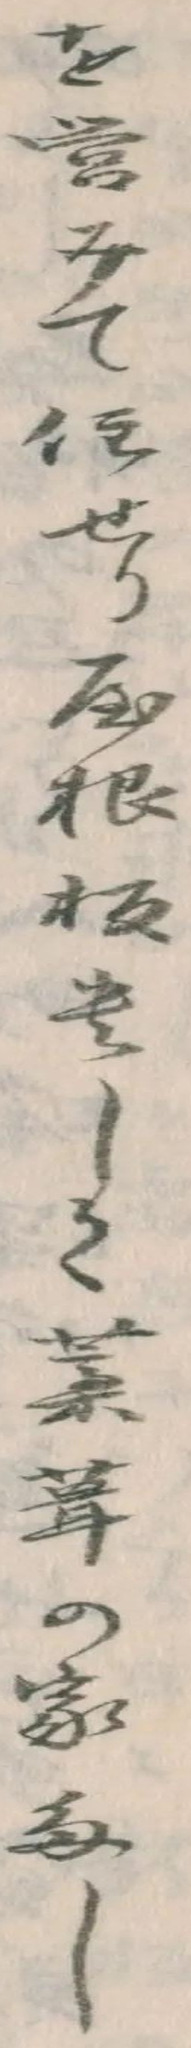を営みて住せり屋根板貴して藁葺の家多し
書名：地災撮要. 巻7-9(地震之部)
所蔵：国立国会図書館 National Diet Library, JAPAN
